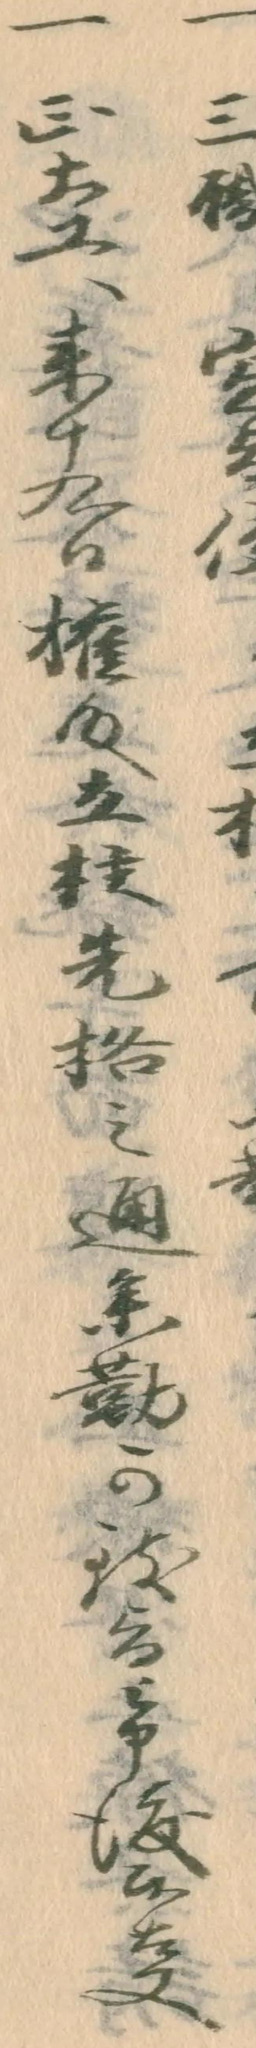一正大工へ来十九日権殿立柱先格之通参勤可致旨被申渡候事
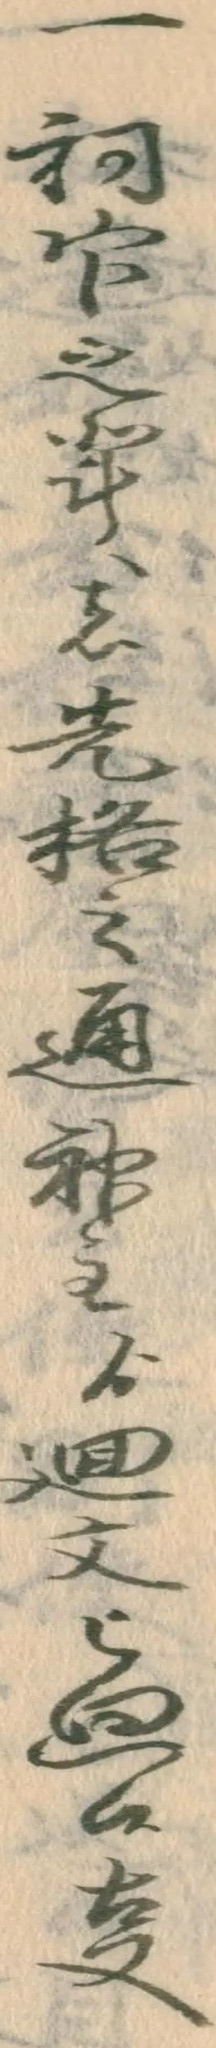一祠官之輩へは先格之通神主ゟ廻文被廻候事
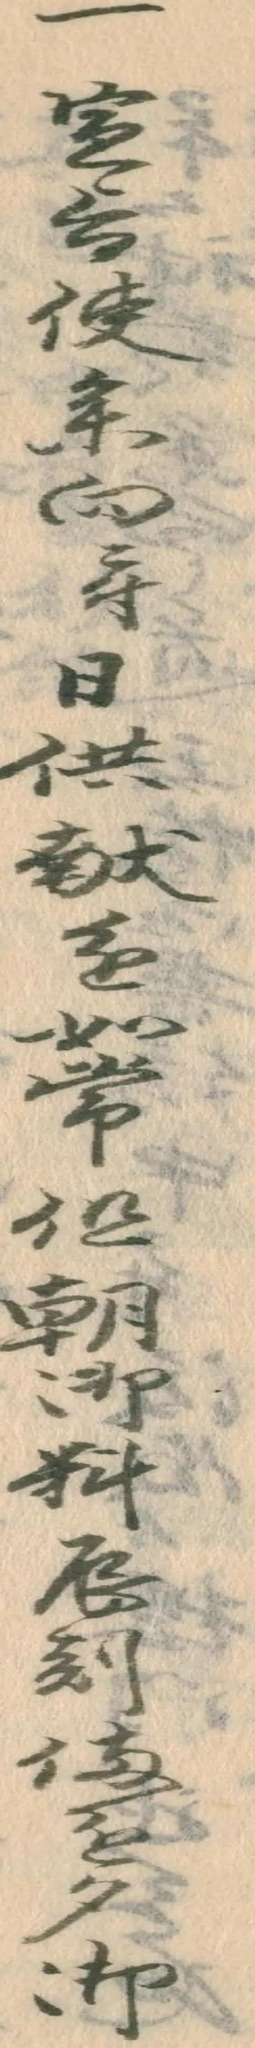一宣旨使参向ニ付日供献進如常但朝御料辰刻備進夕御
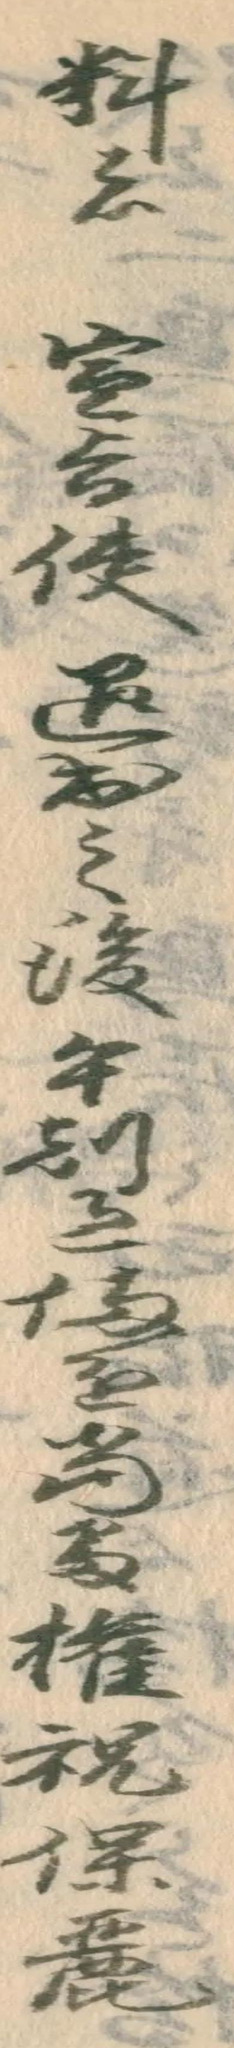料は宣旨使退出之後午刻過備進当番権祝保麗
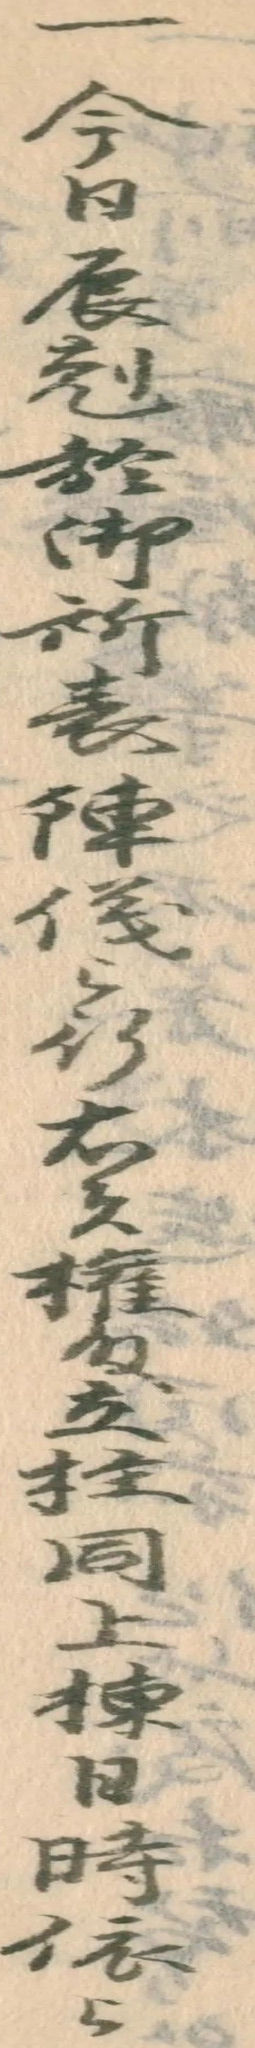一今日辰剋於御所表陣儀被行右者権殿立柱同上棟日時依被
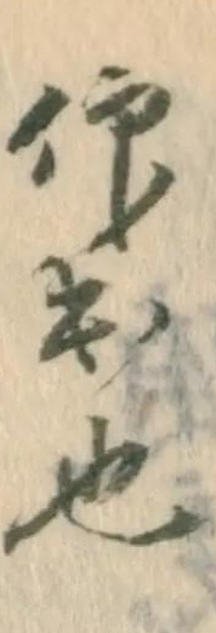仰出也
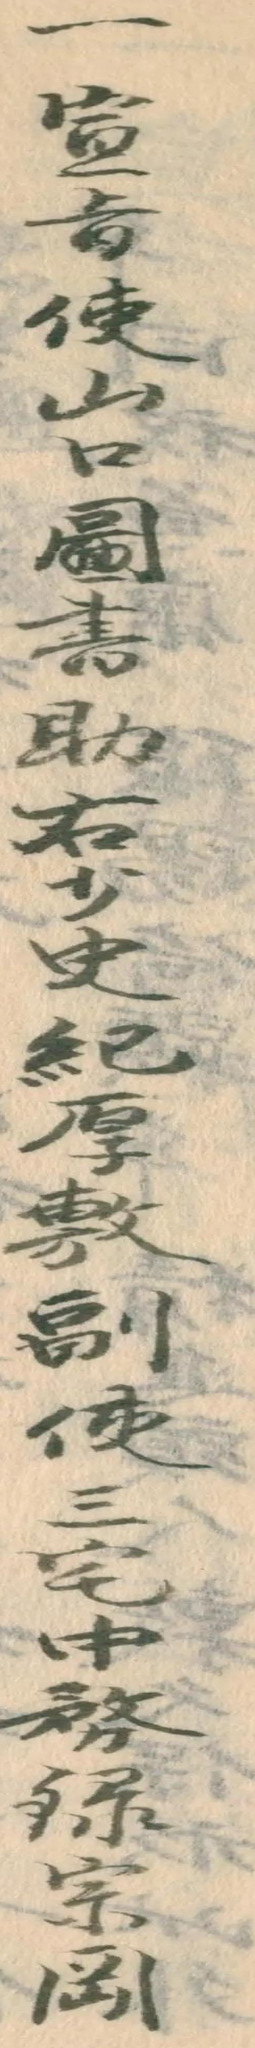一宣旨使山口図書助右少史紀厚敷副使三宅中務録宗岡
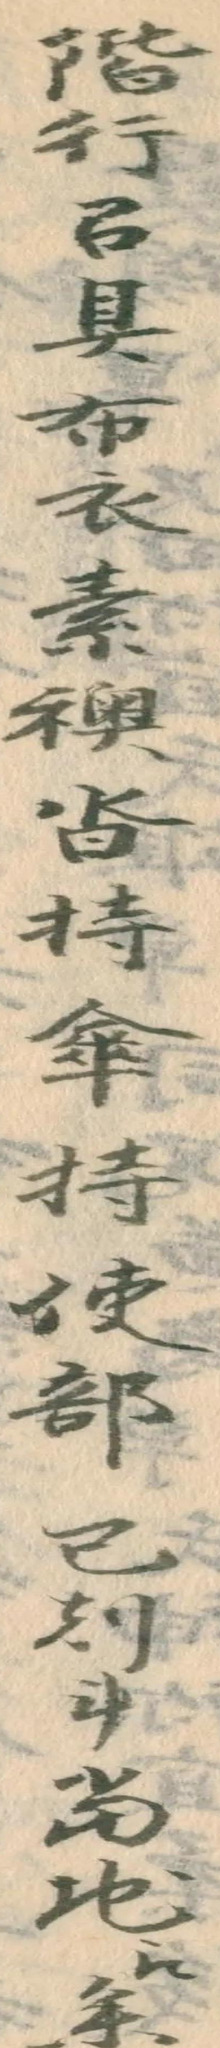階行召具布衣素襖沓持傘持使部巳刻計当地江参
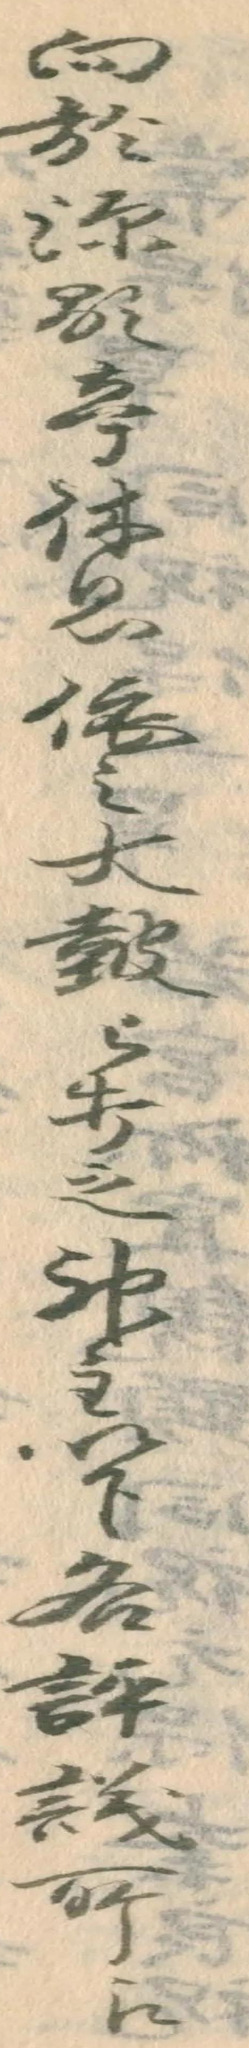向於源顕亭休息依之大鼓被打之神主以下各評議所江
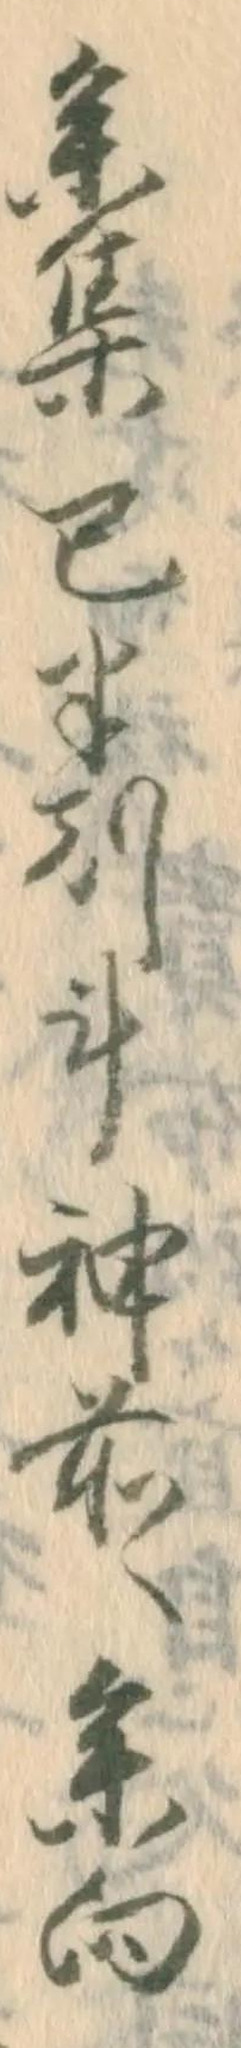参集巳半刻計神前へ参向
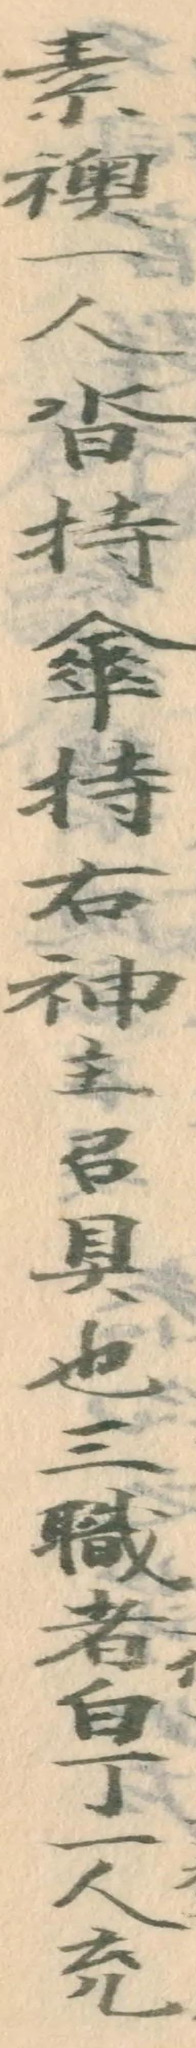素襖一人沓持傘持右神主召具也三職者白丁一人充

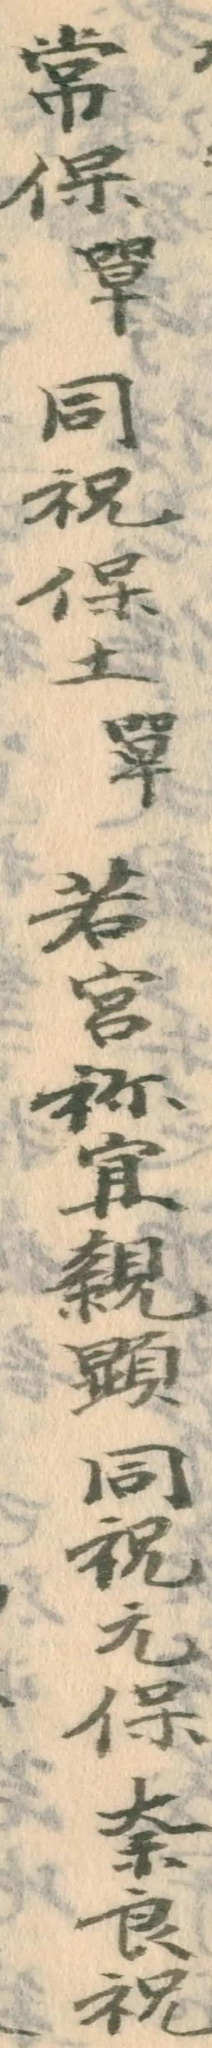常保単同祝保土単若宮祢宜親顕同祝元保奈良祝
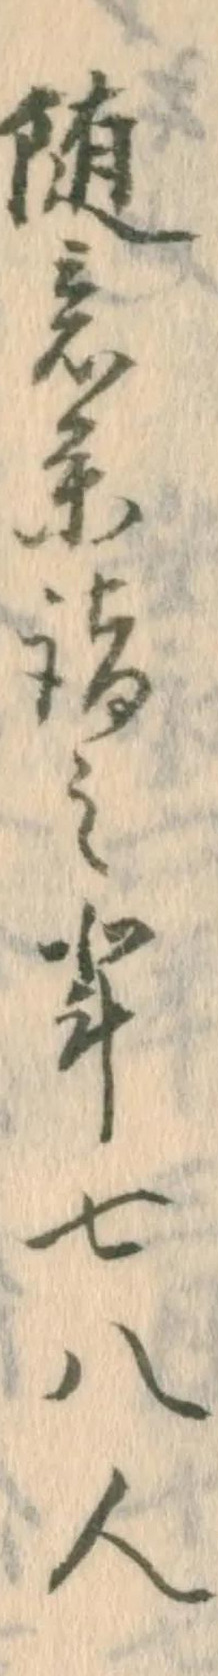随意参詣之輩七八人
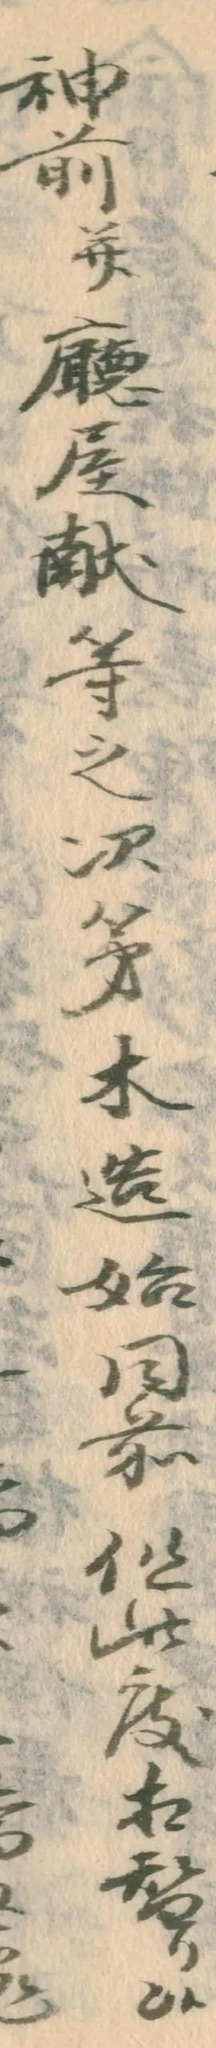一神前并庁屋献等之次第木造始同前但此度相替り候
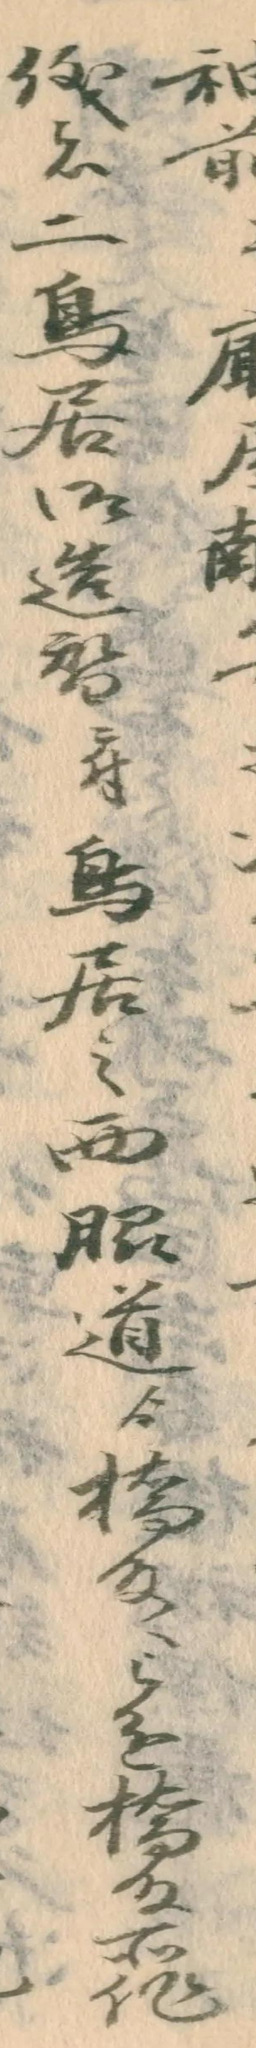儀は二鳥居御造替ニ付鳥居之西脇道ゟ橋殿へ被進橋殿所作
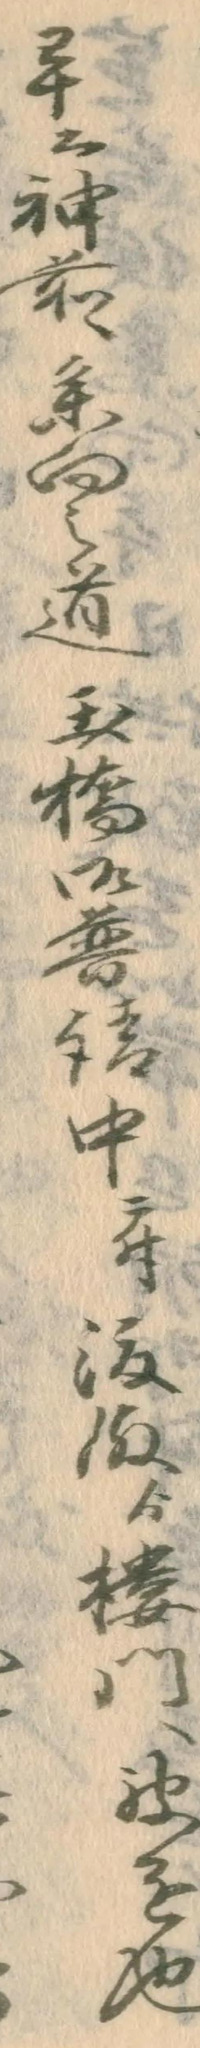畢而神前へ参向之道玉橋御普請中ニ付渡殿ゟ楼門へ被進也
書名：賀茂社記録. 第17冊
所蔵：国立国会図書館 National Diet Library, JAPAN
